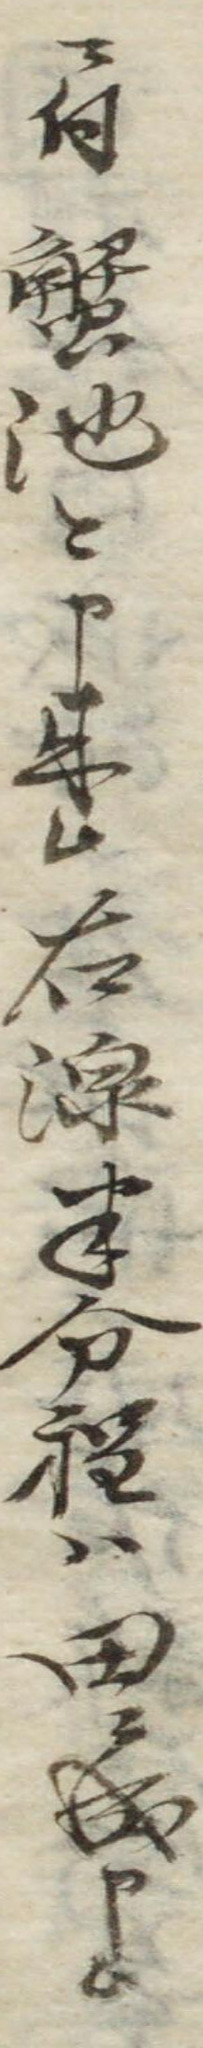に付蟹池と申来候右湶半分程は田に成申候
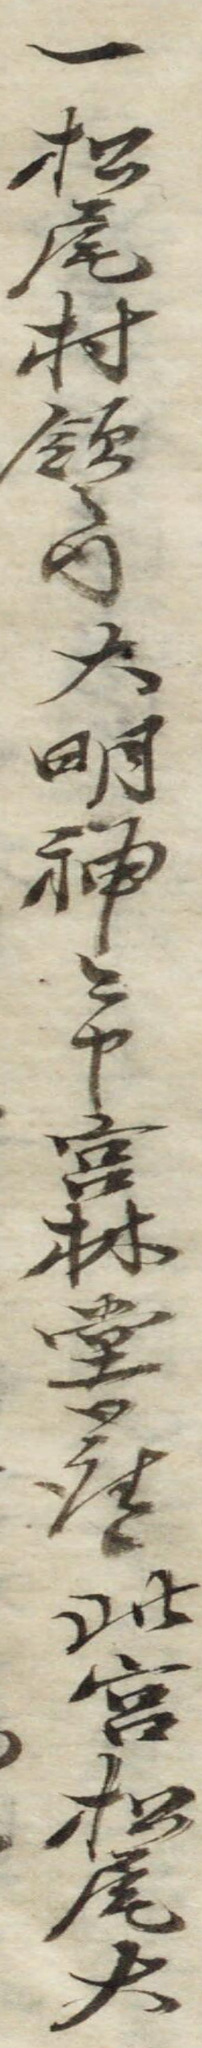一松尾村領之内大明神と申宮林堂御座候此宮松尾大
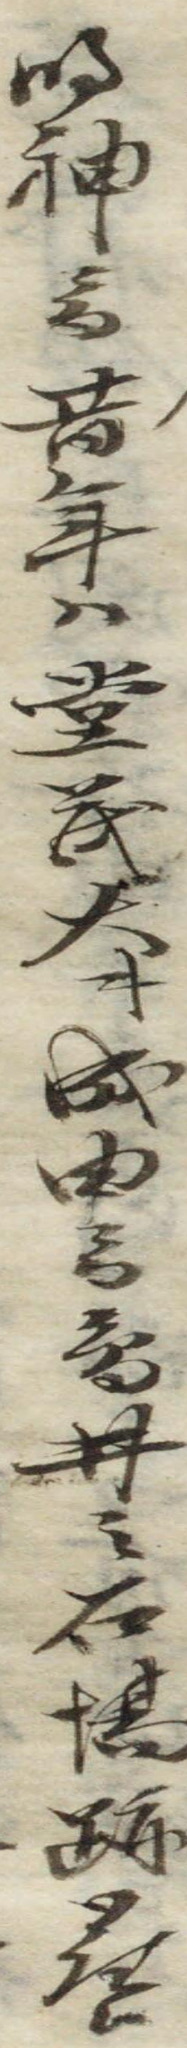明神に而昔年は堂も大キ成由に而鳥井之石場跡御座候
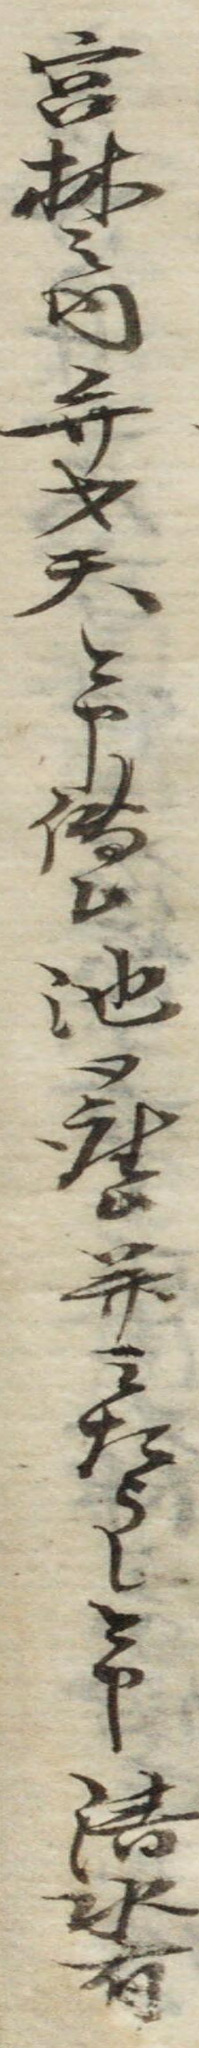宮林之内弁才天と申伝候池御座候并みたらしと申清水有

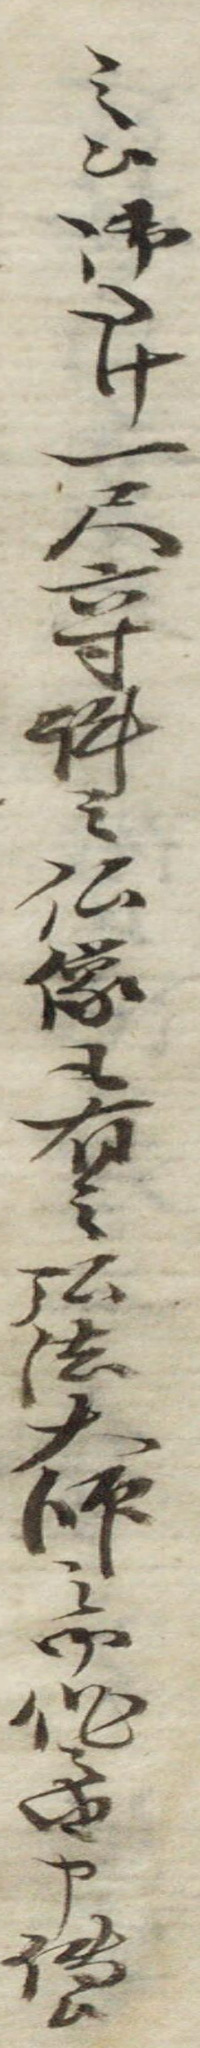之候御たけ一尺六寸許之仏像も有之弘法大師之御作之由申伝候
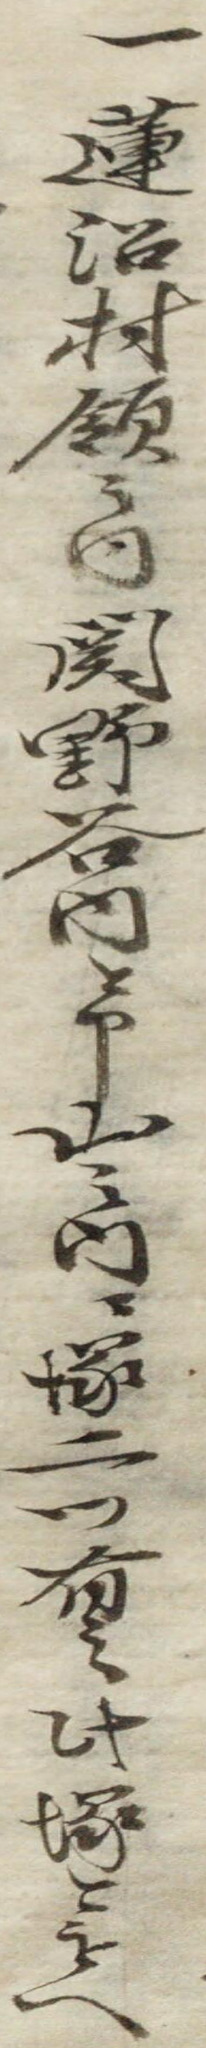一蓮沼村領之内関野谷内と申山之内に塚二ッ有之此塚ともへ
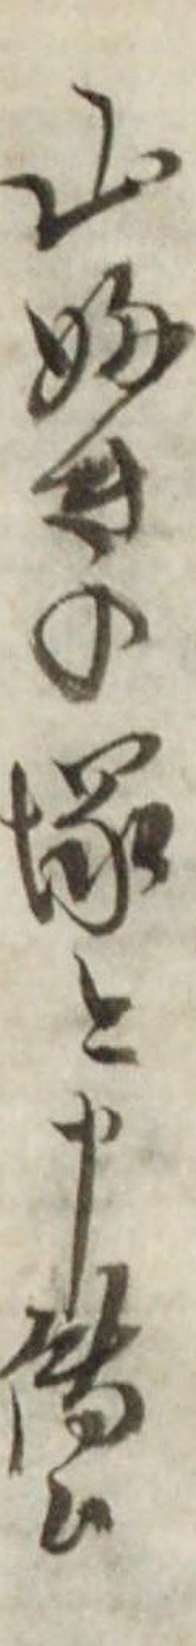山好きの塚と申伝候
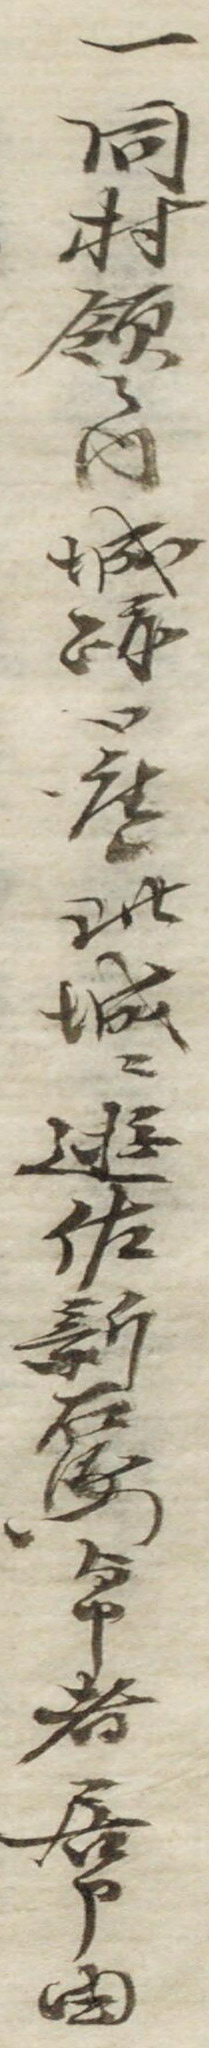一同村領之内城跡城跡御座候此城に遊佐新右衛門与申者居申由
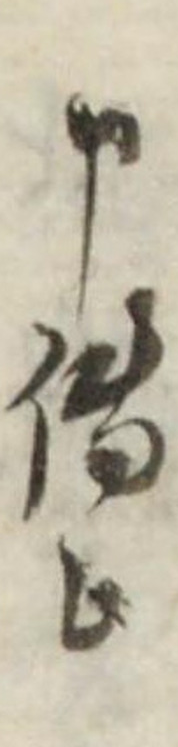申伝候
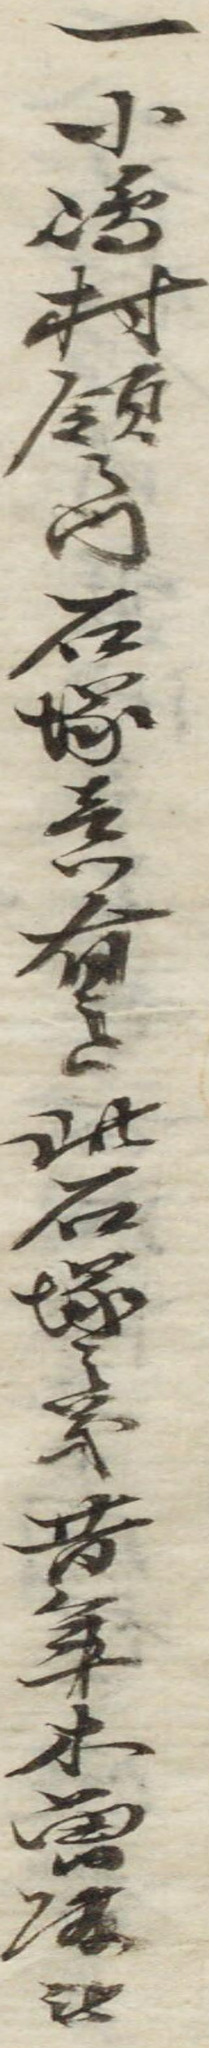一小嶋村領之内石塚壱つ有之は此石塚之義昔年き木曽殿被
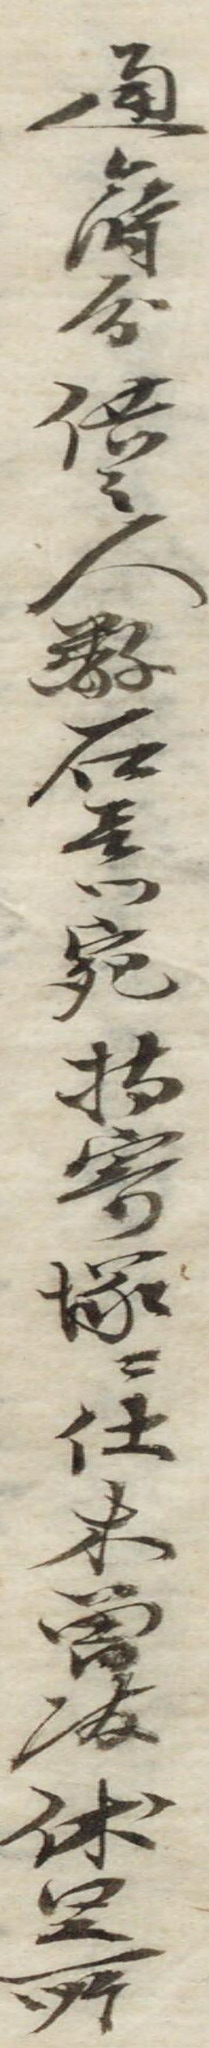通候時分供之人数石壱つ宛持寄塚に仕木曽殿休足所
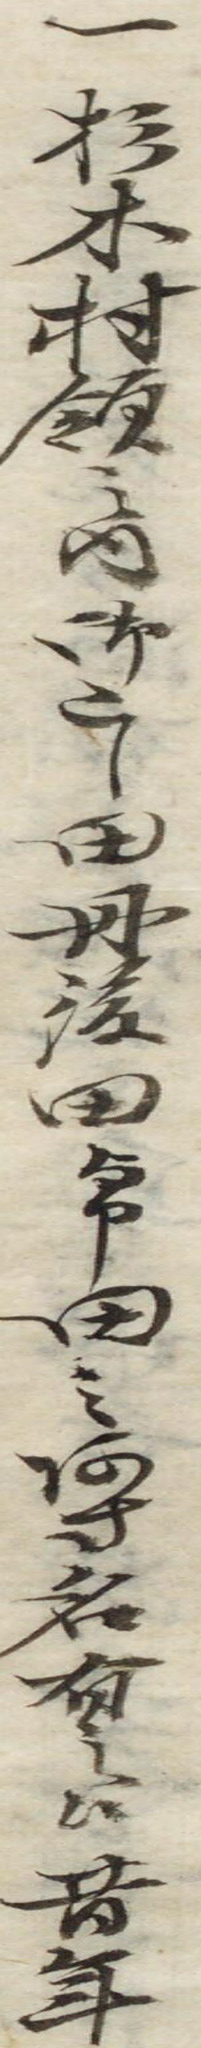一杉木村領之内御こし田丹後田与申田之あさ名有之候昔年
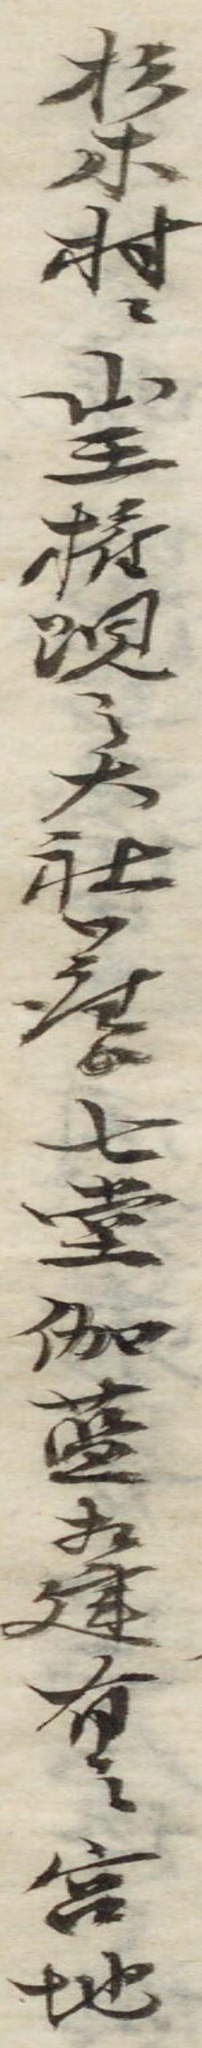杉本村に山王権現之大社御座候七堂伽藍相建有之宮地
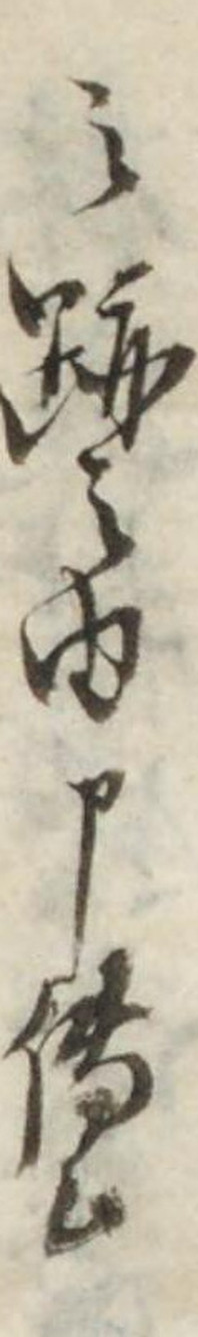之跡之由申伝候
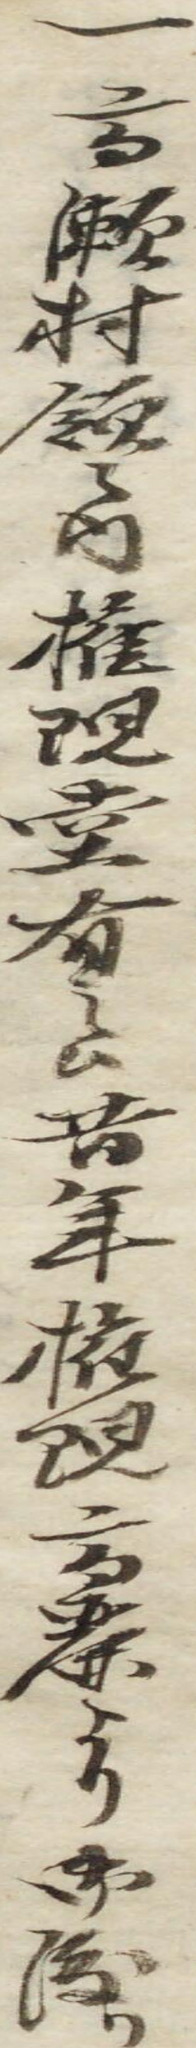一高瀬村領之内権現堂有之候昔年権現高麗より御渡り
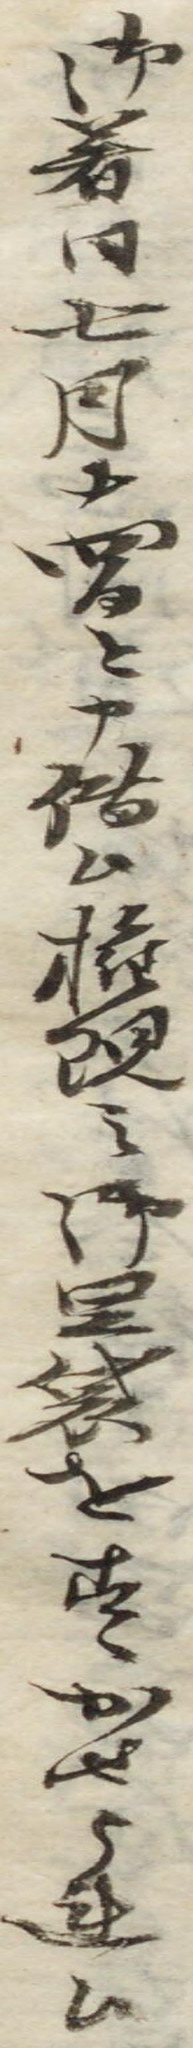御着日七月十四日と申伝候権現之御足袋をすゝかせられ候
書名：加越能旧聞録
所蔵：Ishikawa Prefectural Library
